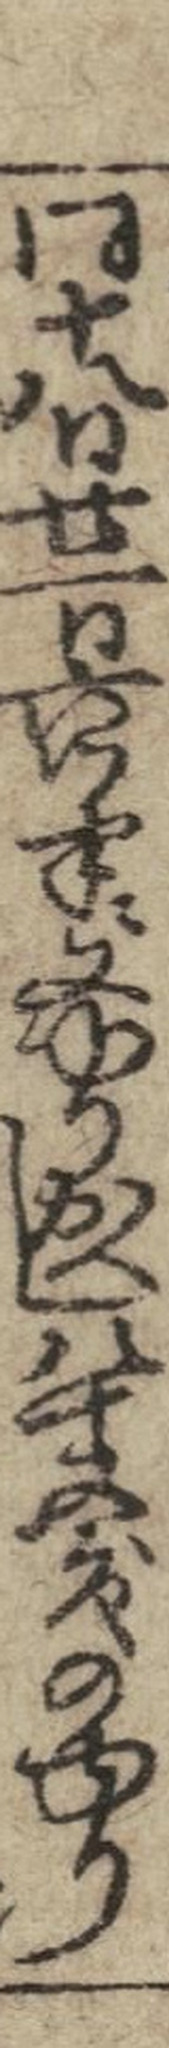同十八日廿一日六ツ半に又ゆりかへし八十五度のゆり
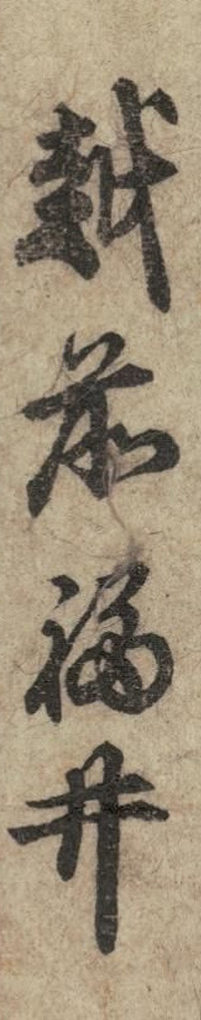越前福井
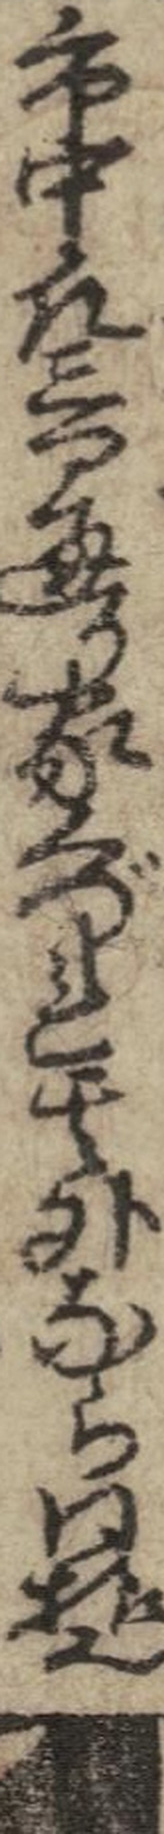市中凡三戸通り家くづれ其外なら同様也
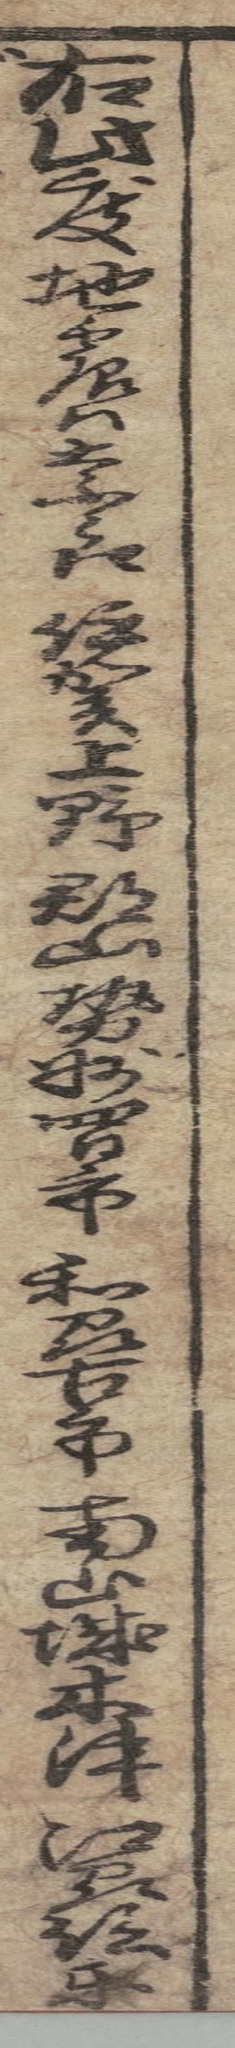右此度地震は奈良伊賀上野郡山勢州四日市和州古市南山城木津江州信楽
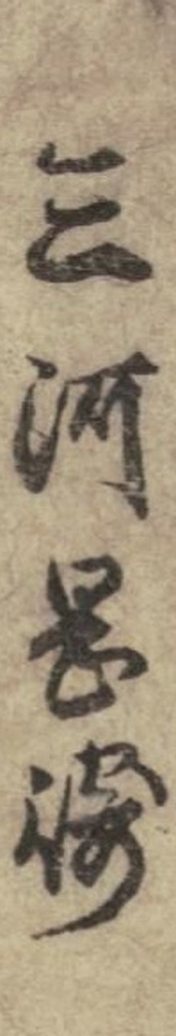三河岡崎
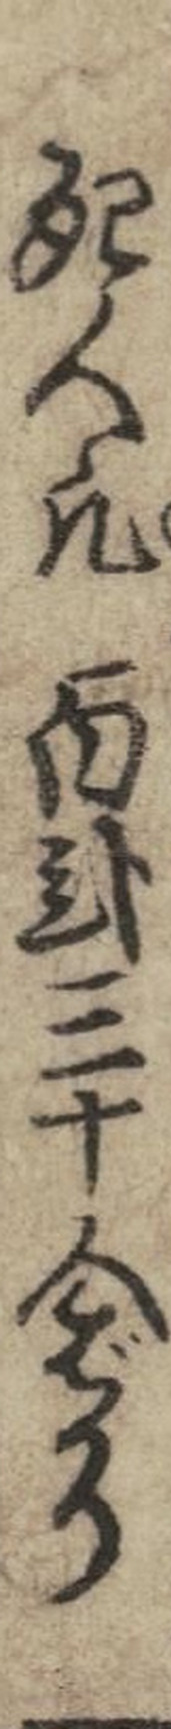死人凡百弐三十人ばかり
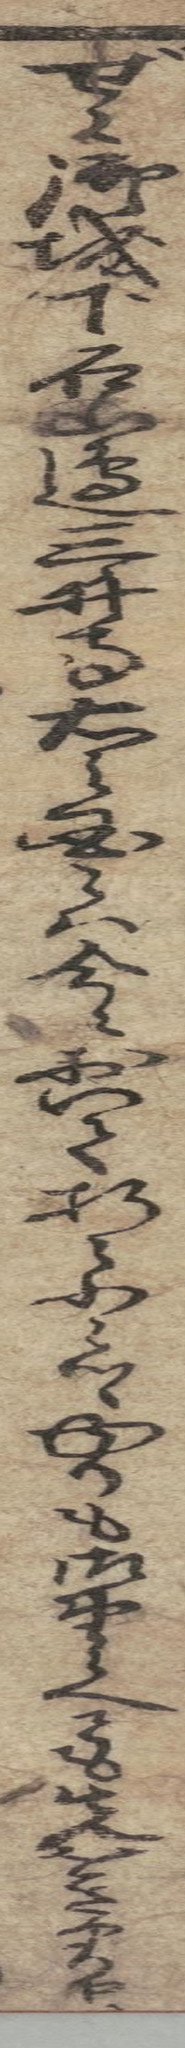ぜ〻御城下石山辺三井寺右之国〻は今において折〻少〻ツヽゆりも御座候へとも先をさゆちや
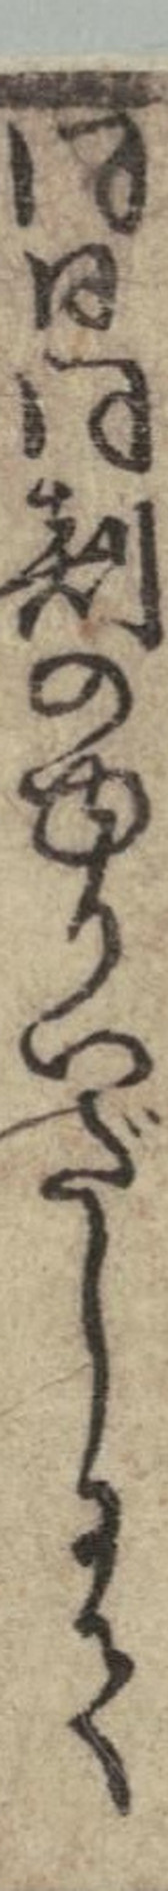同日同刻のゆりいだしにて
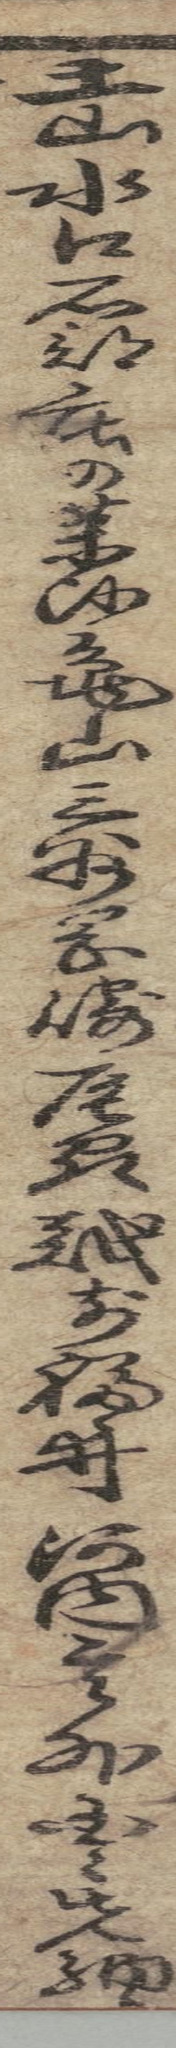土山水口石部庄の茉沙亀山三州岡崎尾州越前福井河内其外国〻先納
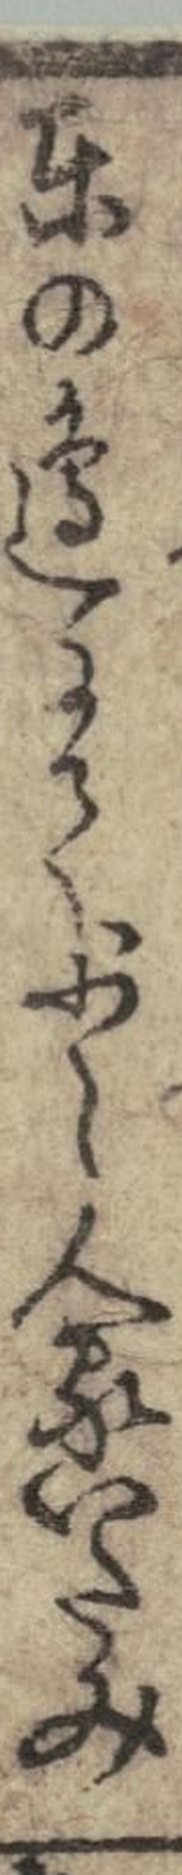東の辺にて少〻人家いたみ
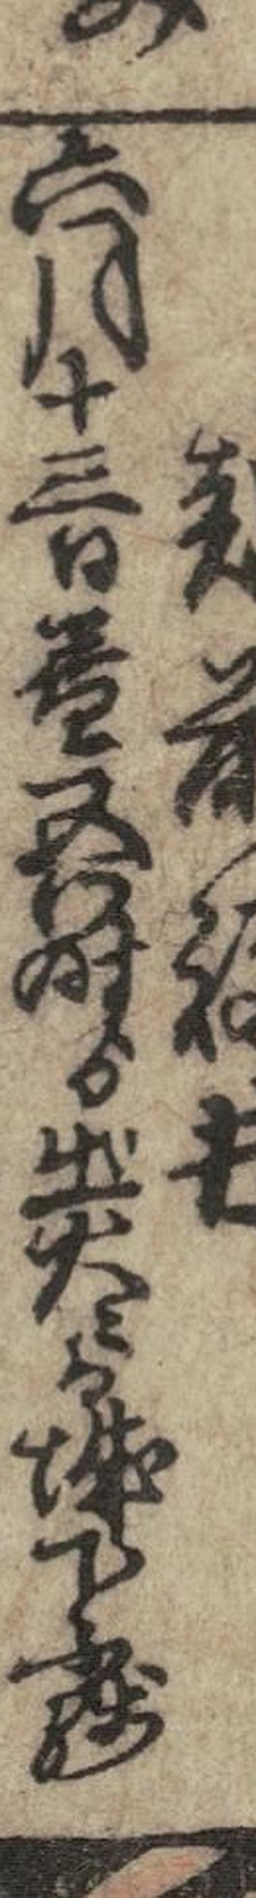六月十三日昼五ツ時ゟ出火にて城下不残
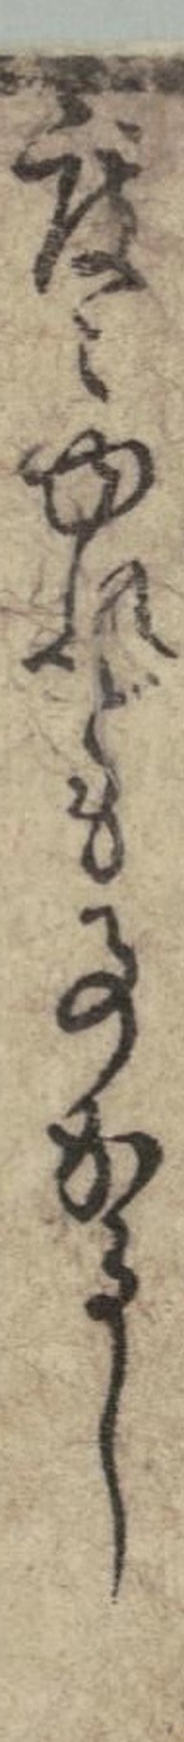度〻ゆれども事かるし
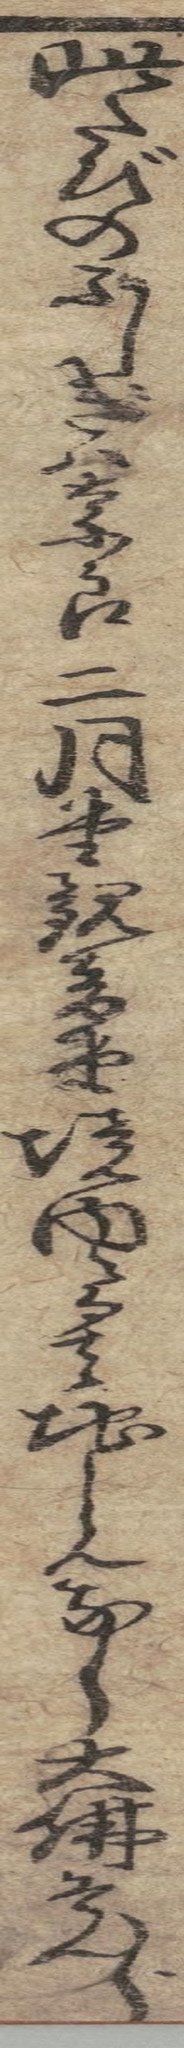此たびのふしぎは奈良二月堂親青堂境内にて其地しんなし大仏そんじ
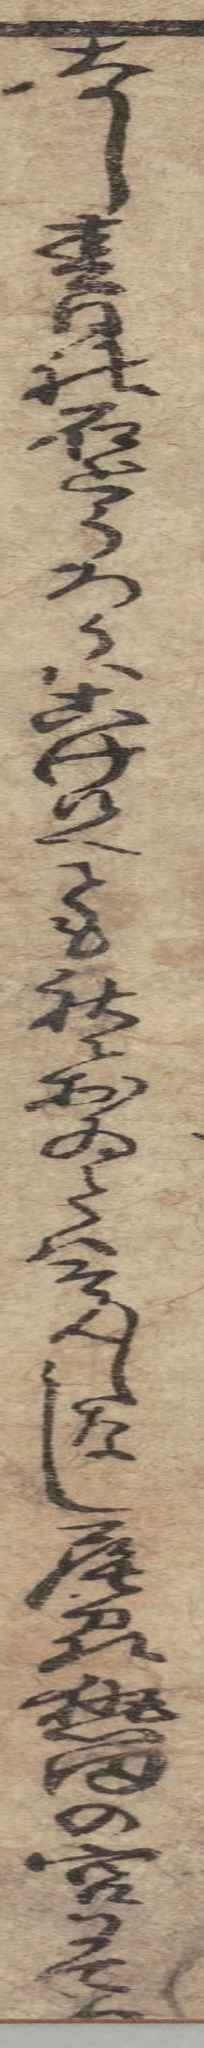なし春日社石とうろうはこけ候へとも社に出給てはそんしなし尾州熱田の宮にては
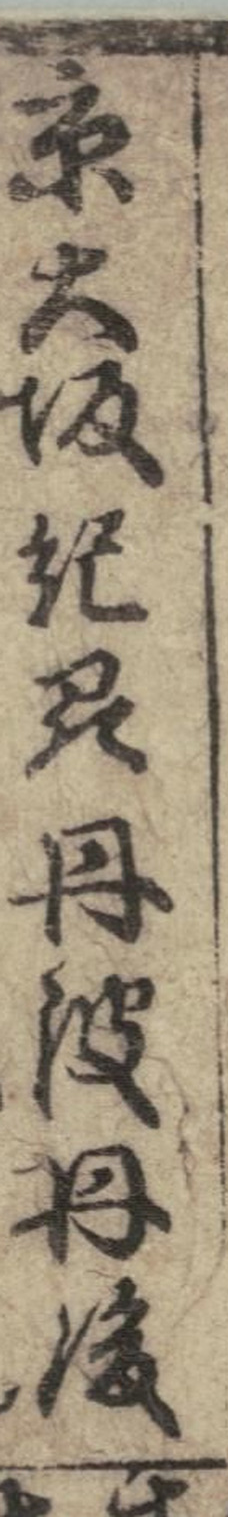京大坂紀州丹波丹後
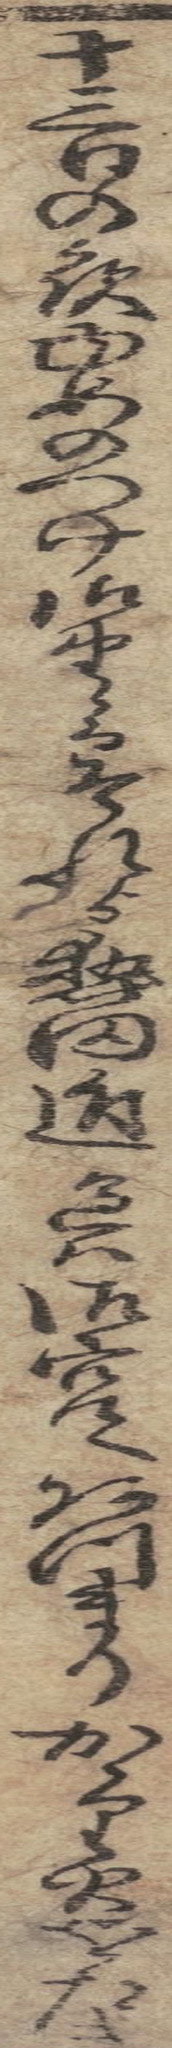十二日の夜ゆめのつけ御座候てそれゟ熱田近辺は御宮へあつまりかゝり火をたき
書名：聞書　諸國大地震并ニ出火・早飛脚廻りにてくわしき所本しらべ　大地震・山城勢州大和三河江州越前　聞書　大地震並ニ出火の次第
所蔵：東京大学地震研究所図書室 Earthquake Research Institute Library, The University of Tokyo, JAPAN
